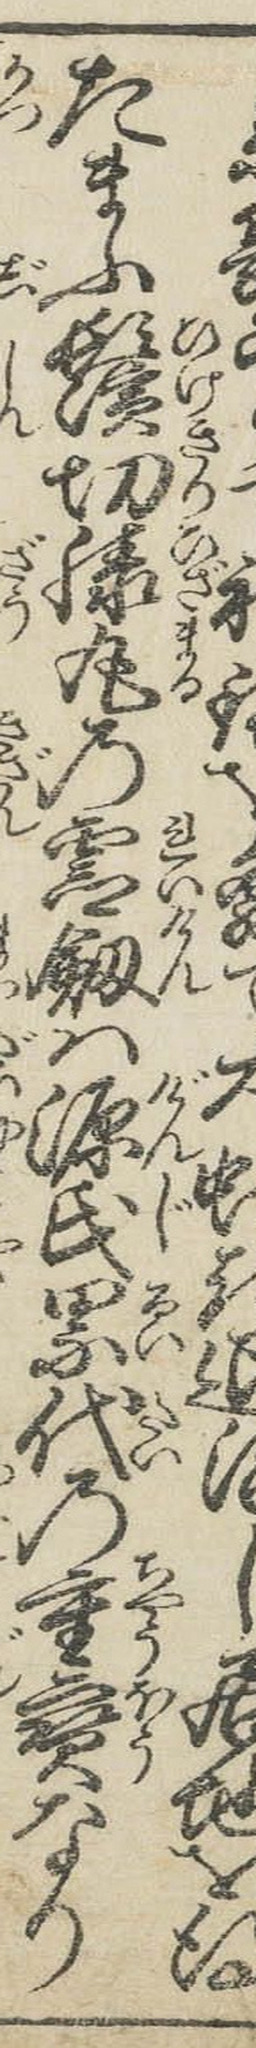たまふ鬚切膝丸の霊剣は源氏累代の重宝なり
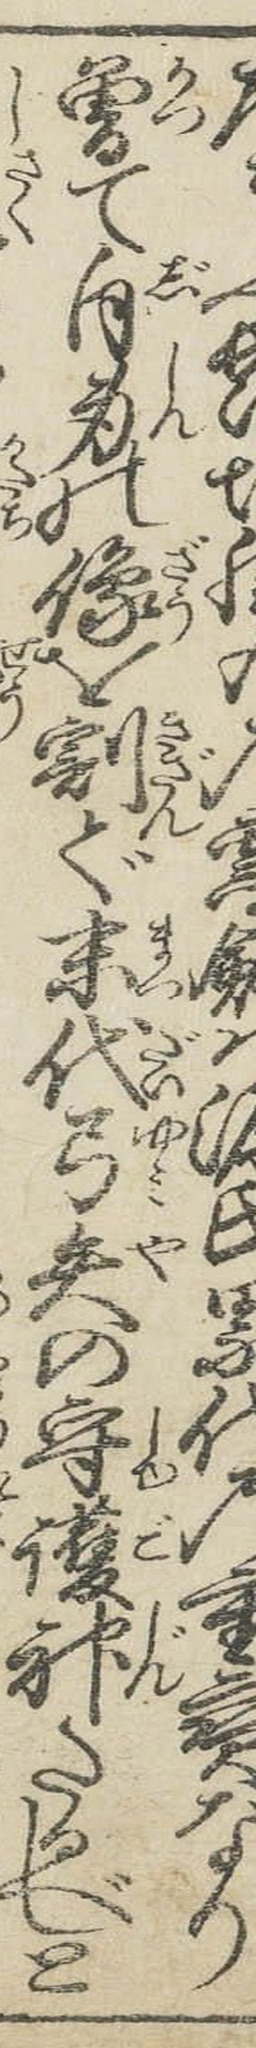曽て自身の像を割で末代弓矢の守護神たるべしと
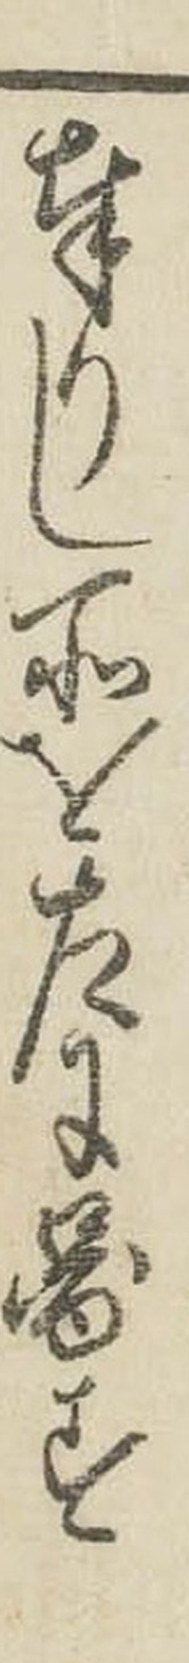奉りし所を左に図す
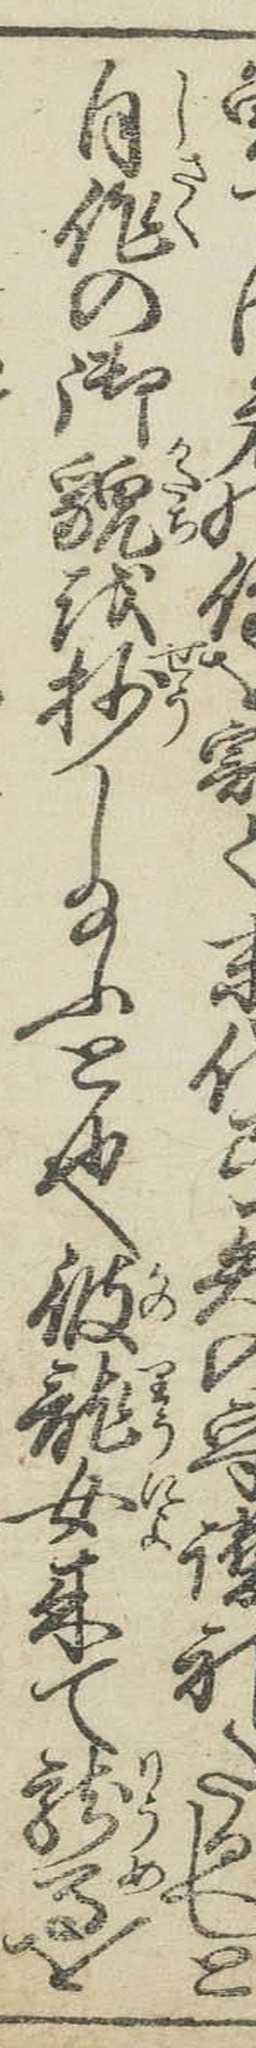自作の御貌を抄し給ふと也彼龍女来て龍馬を
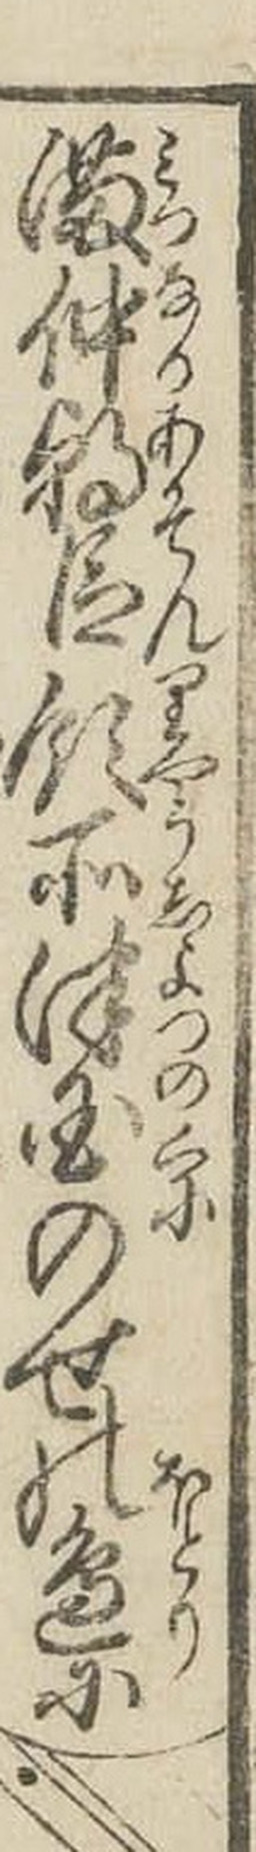満仲朝臣領所津国のせの辺に
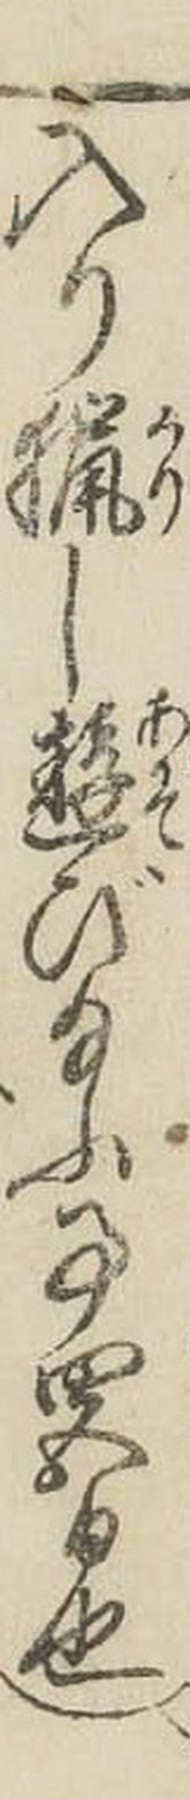入り猟し遊び給ふ事四五日也
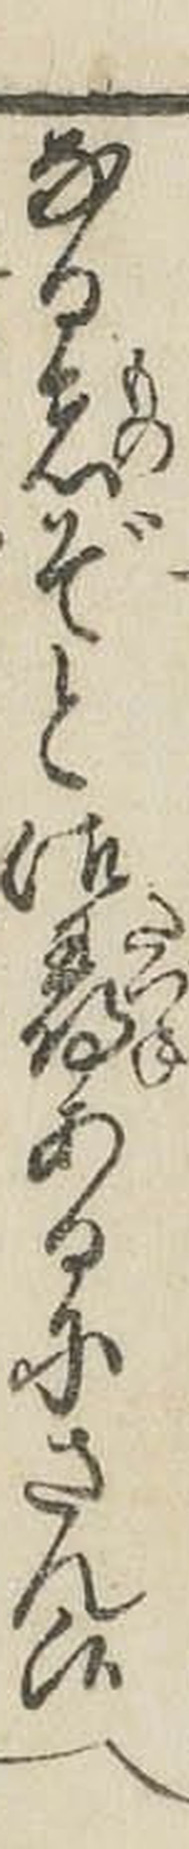なる者ぞと御尋あるにさん候
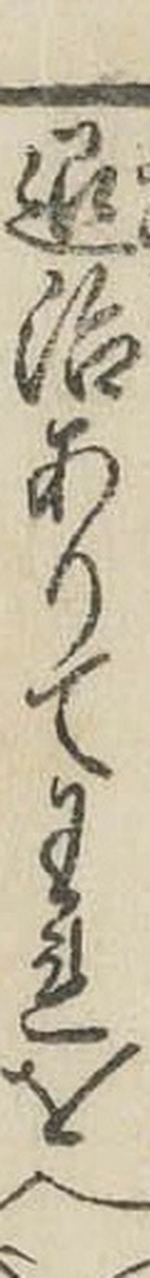退治ありてわれを
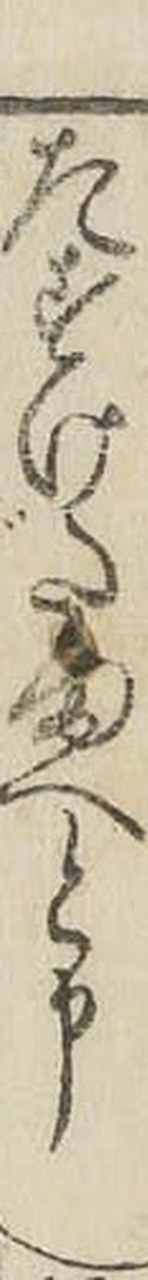たすけたまへと申
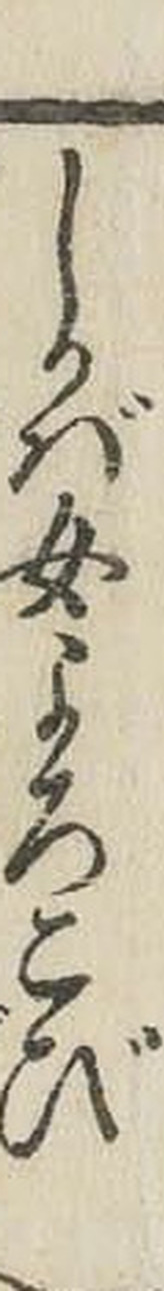しかば女よろこび
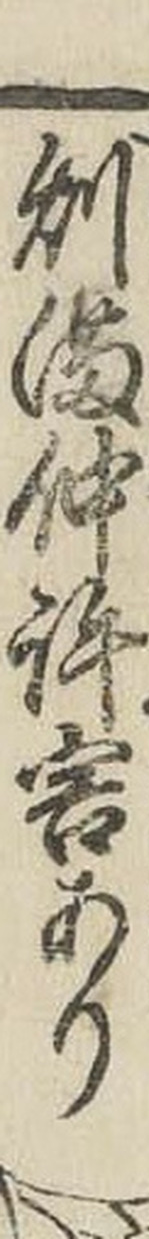則満仲許容あり
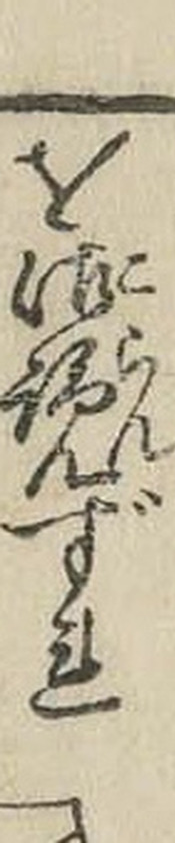を御覧ずれ
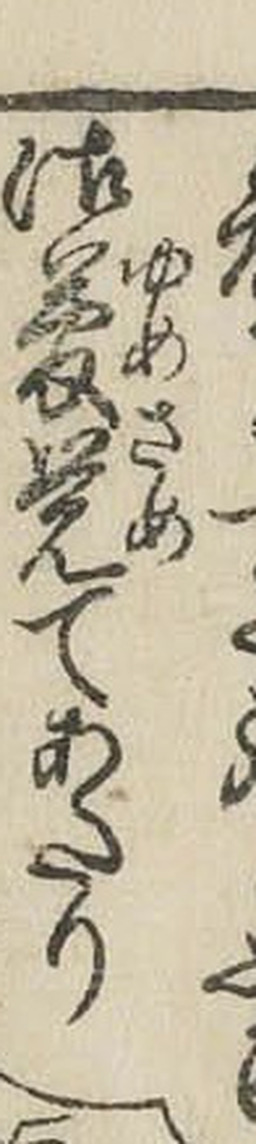御夢覚てあたり
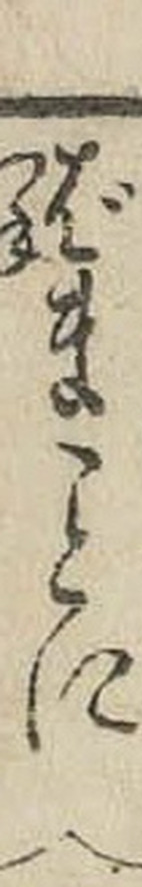ばまことに
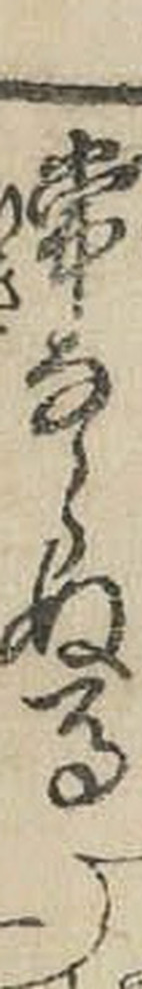常ならぬ馬
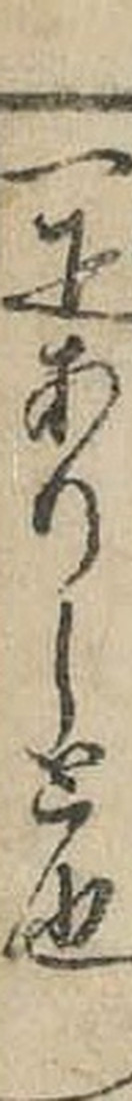一疋ありしと也
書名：絵本写宝袋 9巻 2之巻
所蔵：東京学芸大学教育コンテンツアーカイブ
